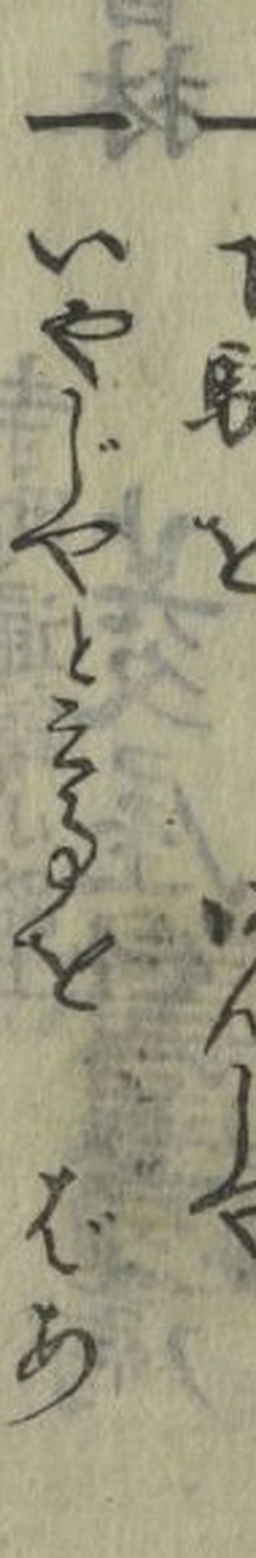一いやじやと云事をばあ
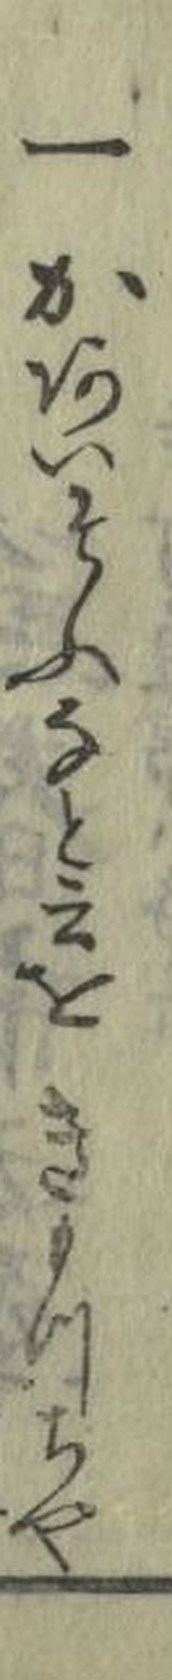一かあいそふなと云をきもつちやげな
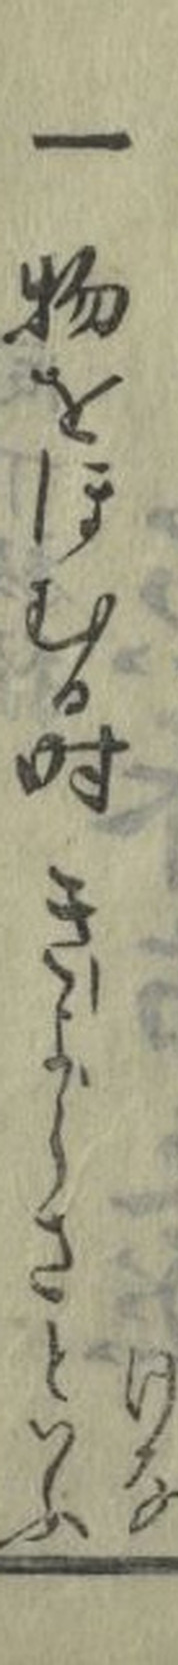一物をほむる時きよらさといふ
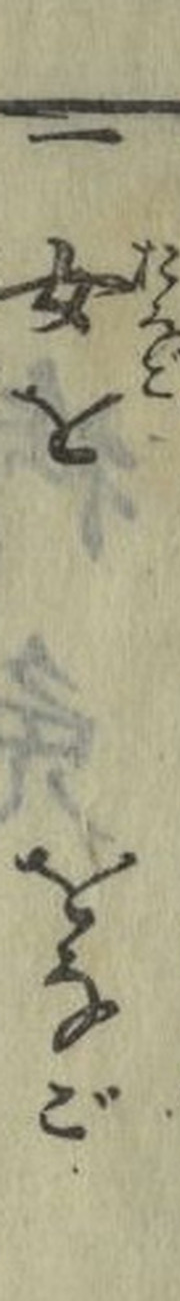一女ををなご
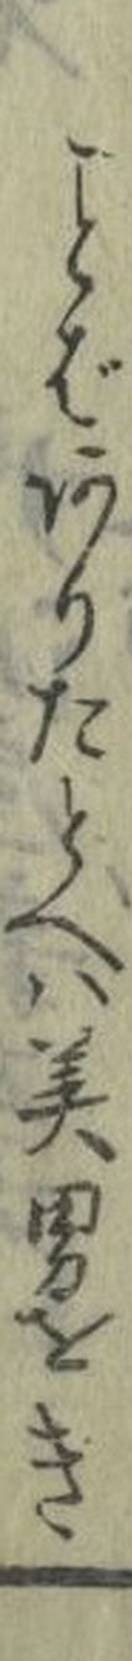ことばありたとへは美男をき
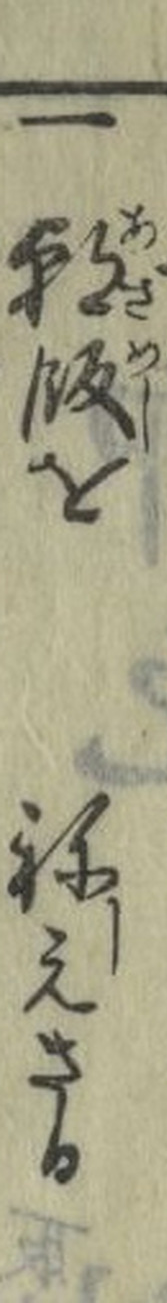一朝飯をねえさる
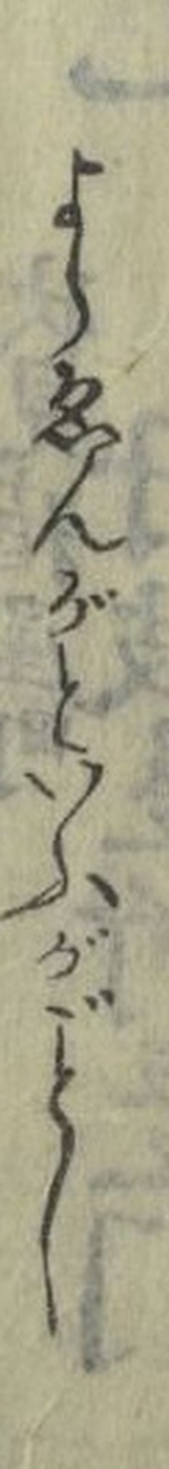よらゑんがといふがごとし
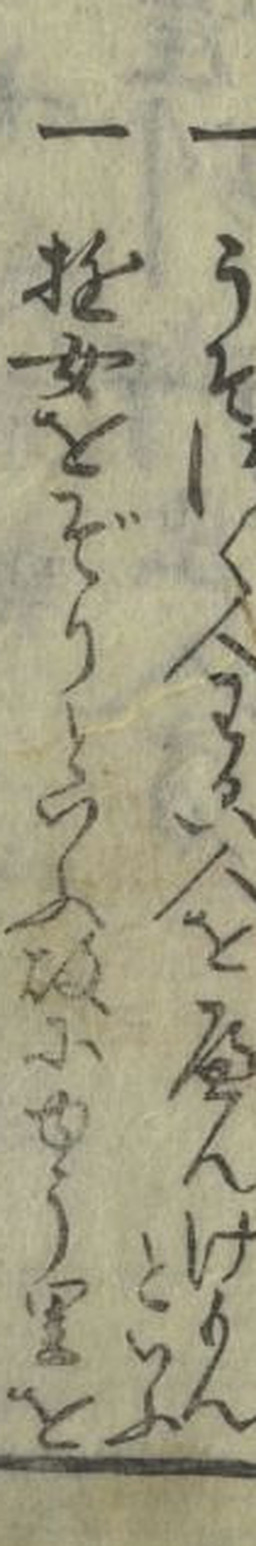一遊女をぞりといふ故にゆう里を
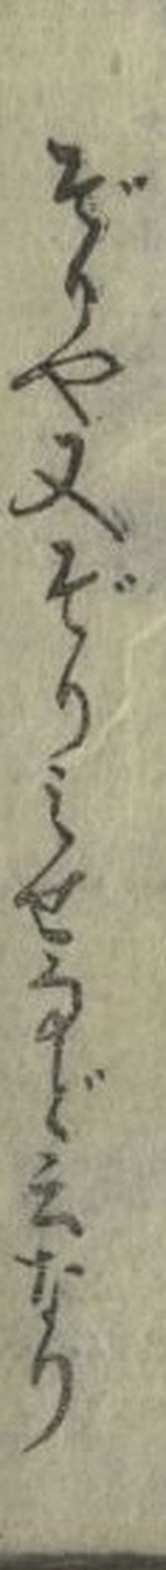ぞりや又ぞりみせなど云なり

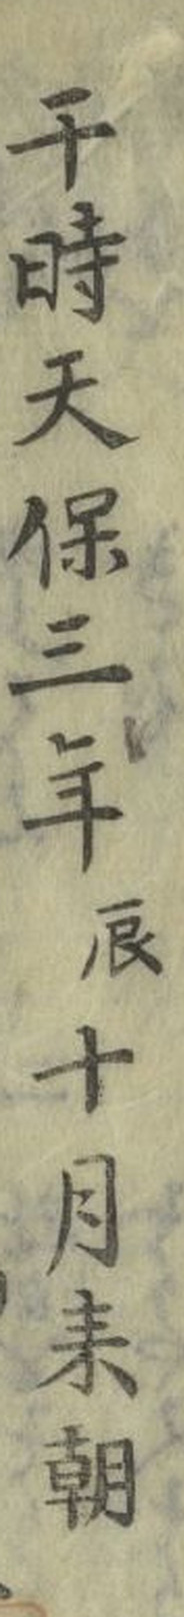于時天保三年辰十月来朝
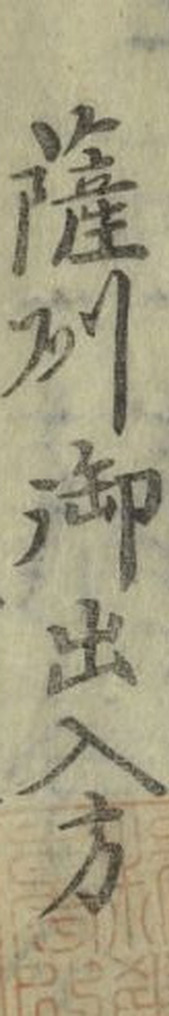薩州御出入方
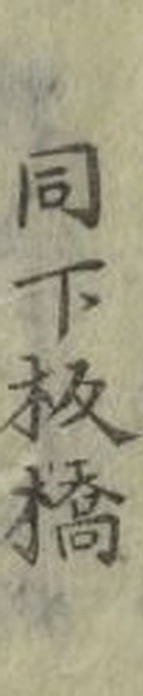同下板橋
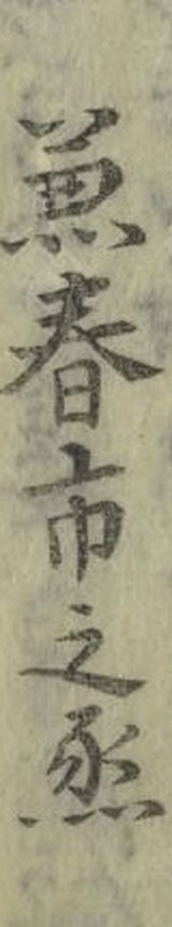兼春市之丞
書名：琉球人行列記
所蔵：University of the Ryukyus Library
